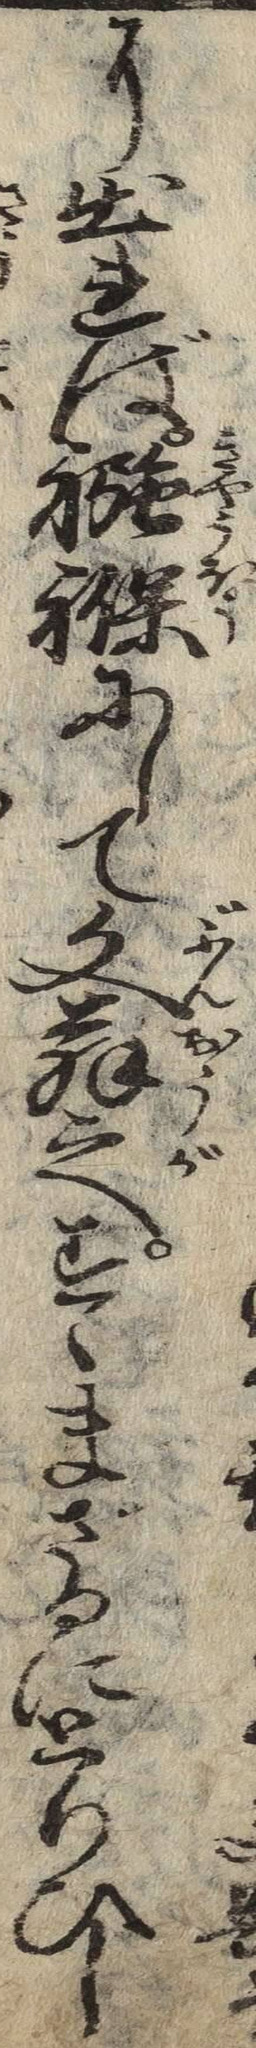に出れば。襁褓にして文翁之。すゝまざるにとりひし
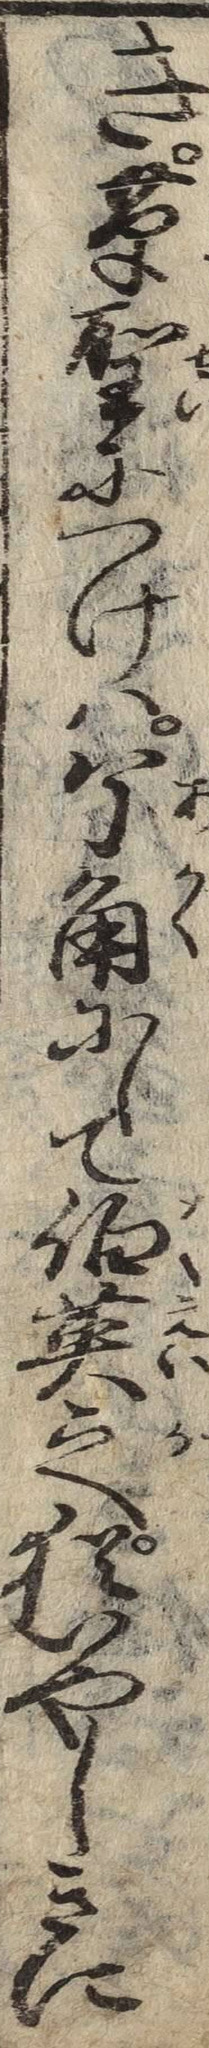き。草聖につけは。丫角にして伯英之。猶いやしきに

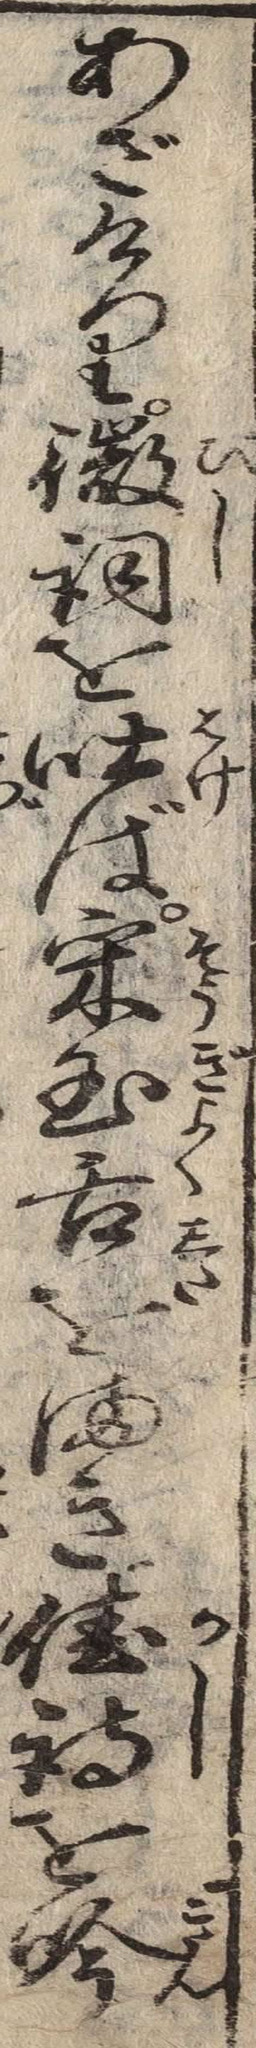あざけり。微詞を吐ば。宗玉舌をまき。佳詩を吟
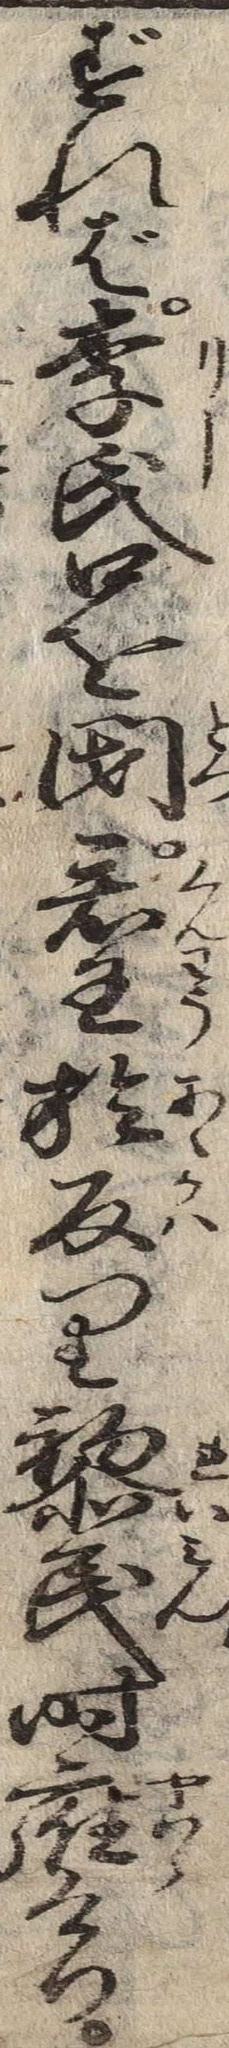ずれば。李氏口を閉。君王於反り黎民時雍けり。
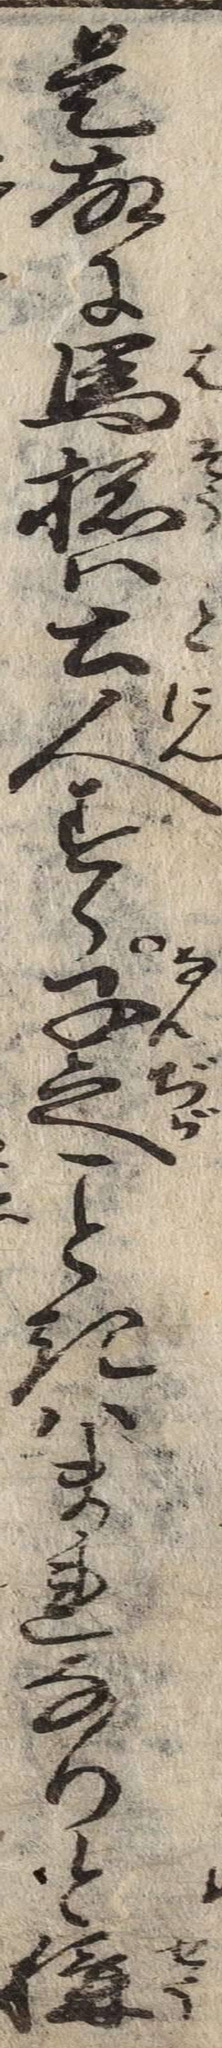是故に馬操は土人すら。子之こときはまれなりと称
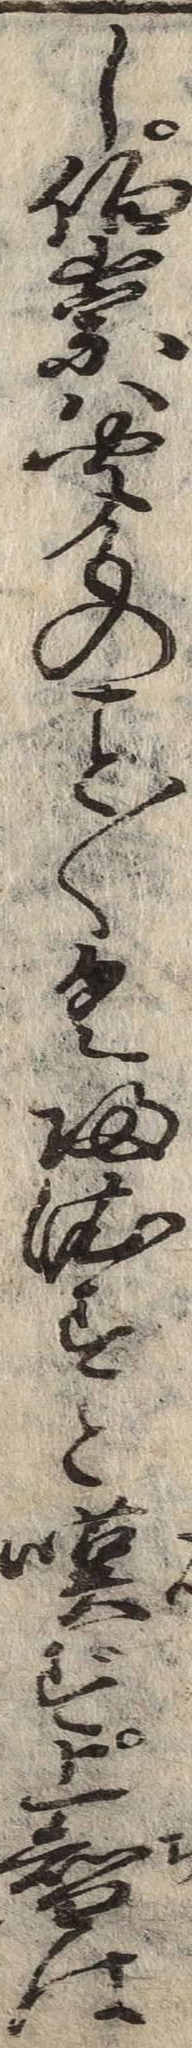し。伯崇は聞ものこと〳〵く帰依すと嘆ず。上智は
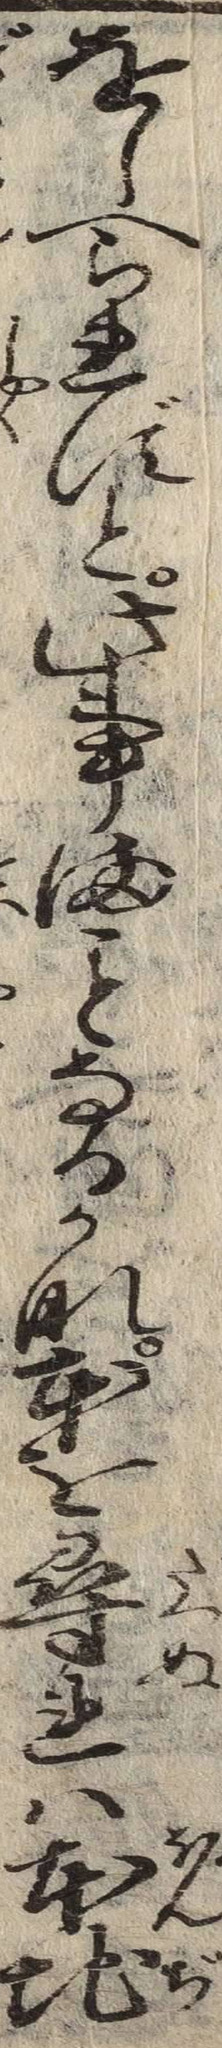をしへられずと。此事まことなるかな。本を尋れは本地
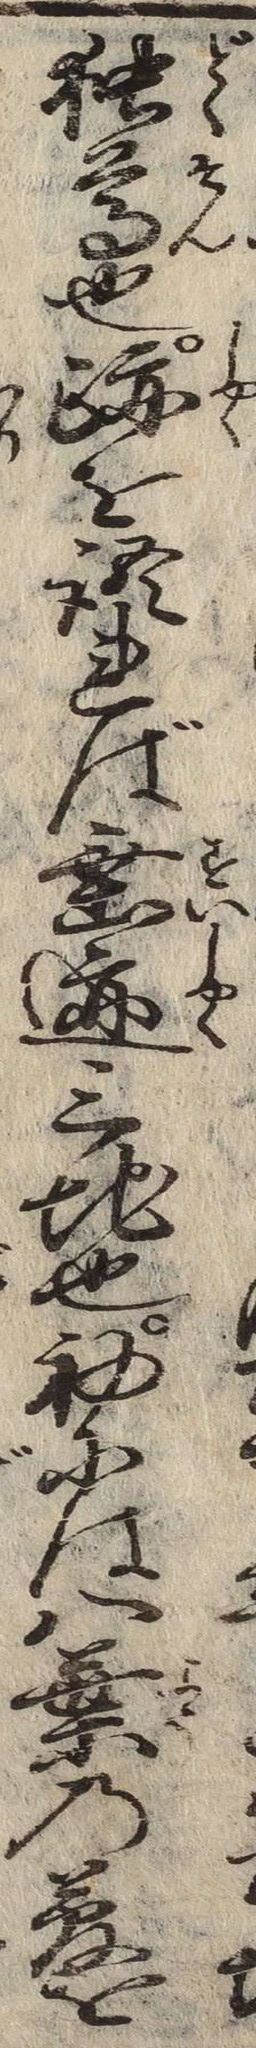独尊也。跡を語れば垂迹三地也。初には八葉の夢を
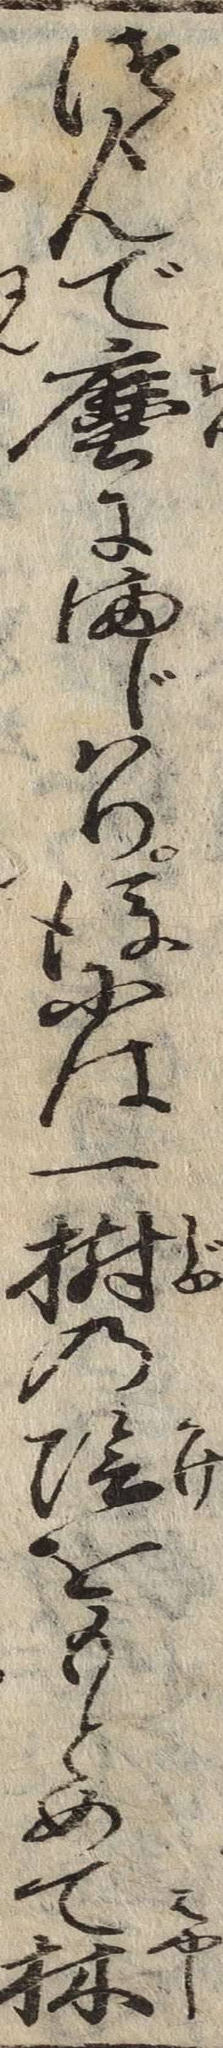つゝんで塵にまじはり。後には一樹の陰をもとめて林
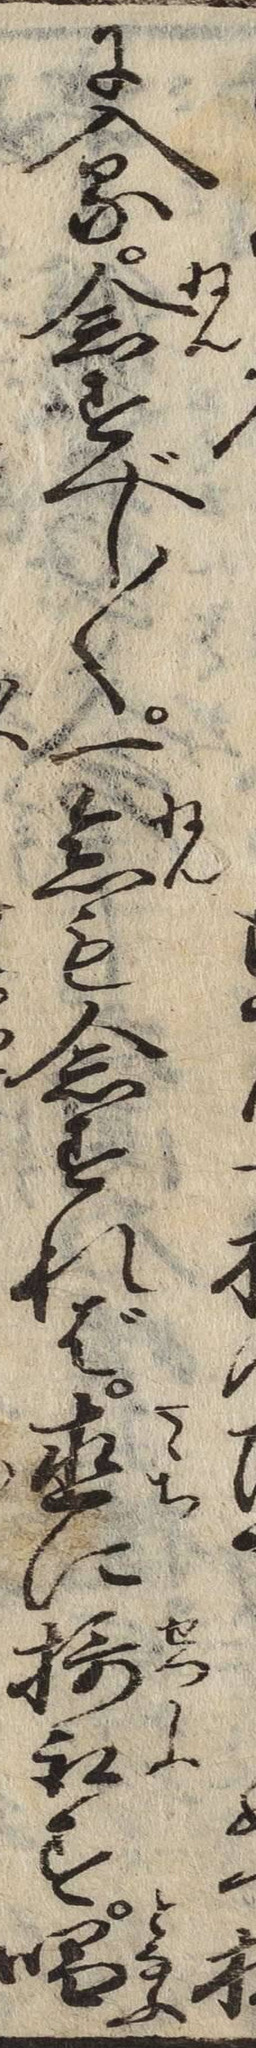に入る。念すべし〳〵。一念も念すれば。直に摂取す。唱
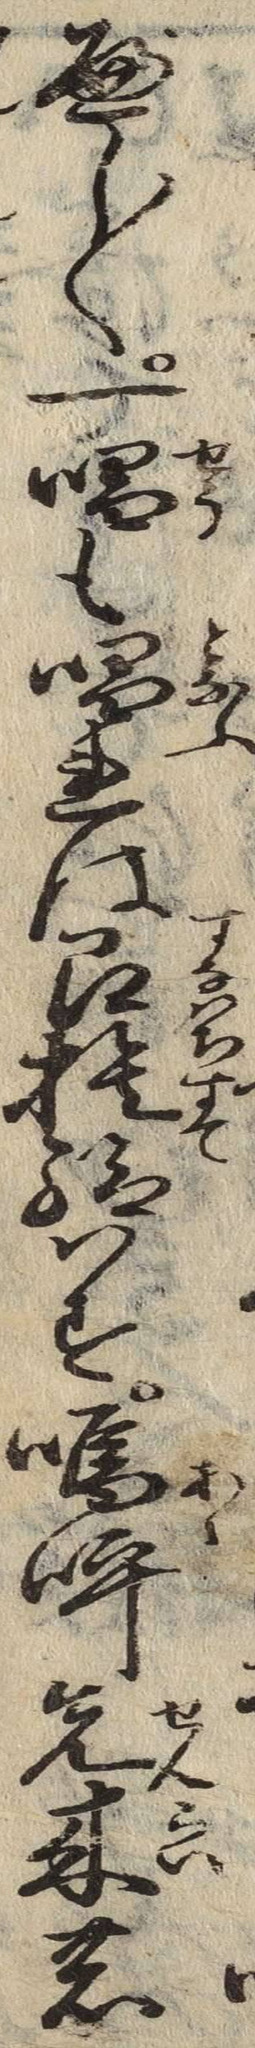べし〳〵。唱も唱れは即捨給はす。嗚呼先来の
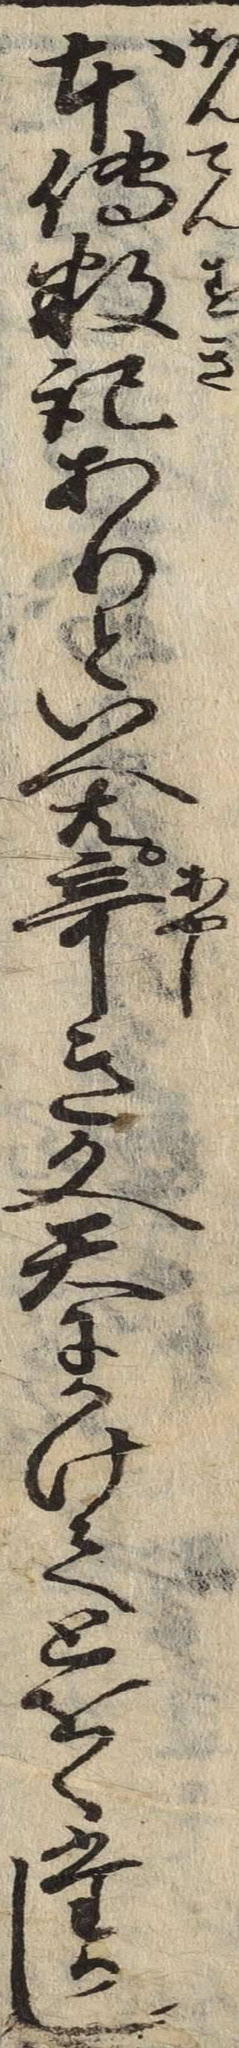本伝数記ありといへ共。奇き文天にかけてとをくたかし
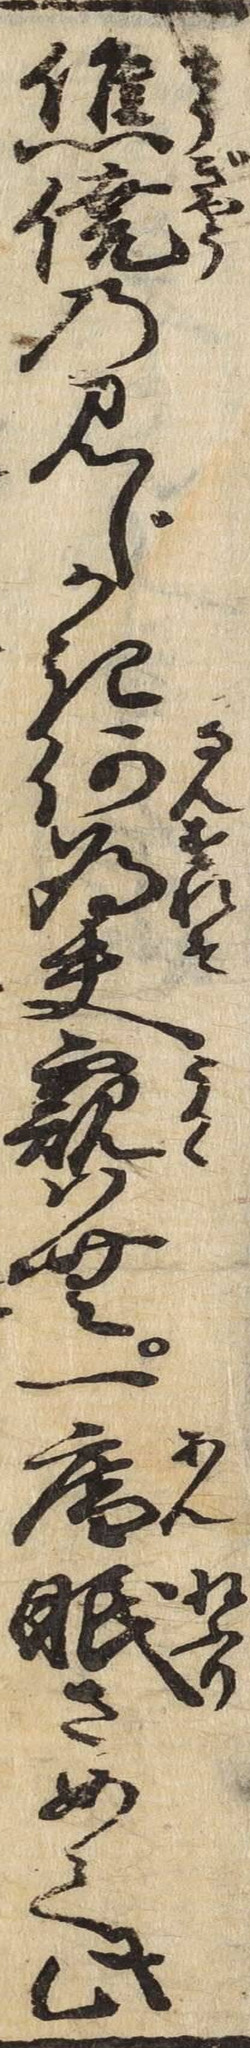焦僥のみじかき何為夫窺はむ。一庵眠さめて此
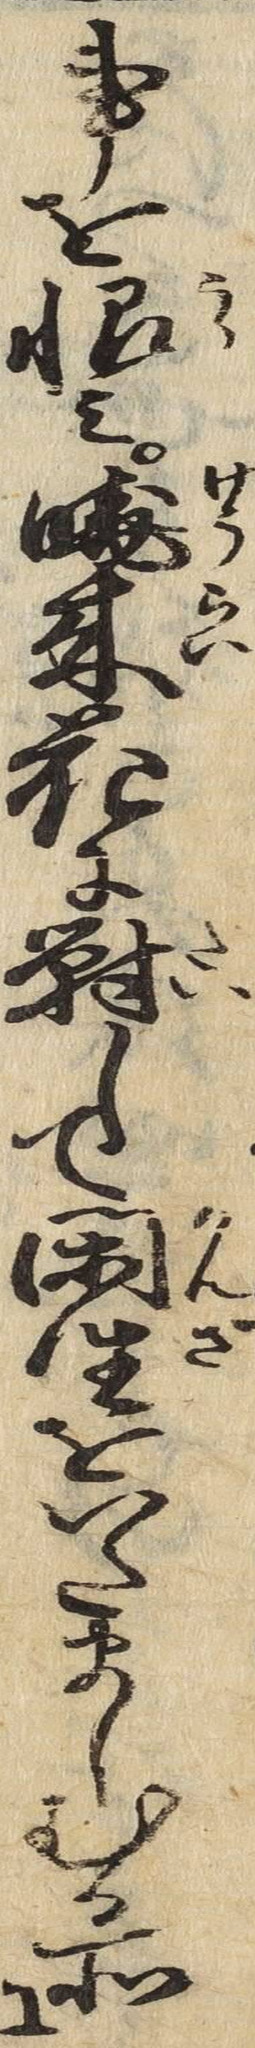事を恨み。暁来花に対して閑座をいたましむる所に
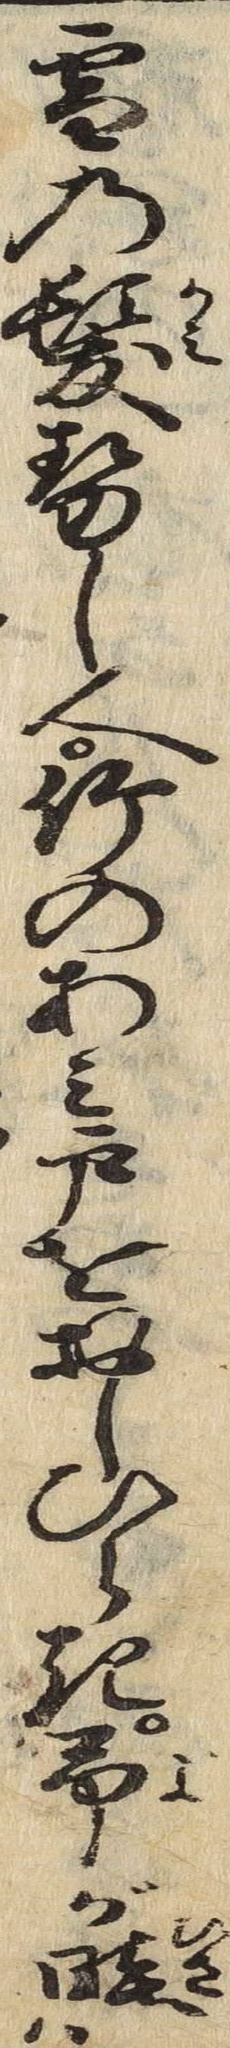雪の髪せし人。竹のあみ戸をおしひらき。予が膝は
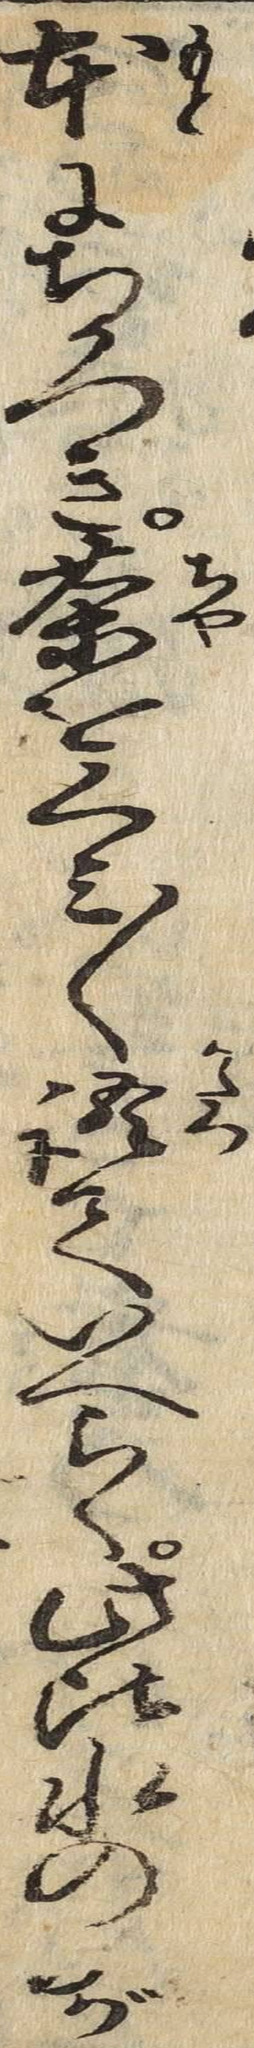本にちかつき。茶をくみ〳〵語ていへらく。此頃水のが
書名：弘法大師御傳記
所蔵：京都府立京都学・歴彩館 国文学研究資料館
